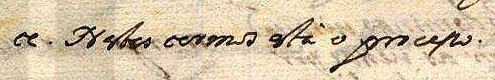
te. Nestes termos està o processo.
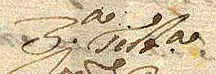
3.a Test.a
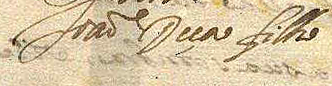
Joaõ Deça filho
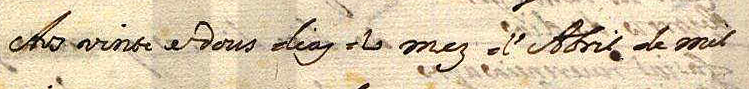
Aos vinte e dous dias do mez d'Abril de mil
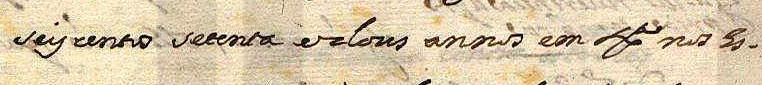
seiscentos setenta e dous annos em Lxa nos Es
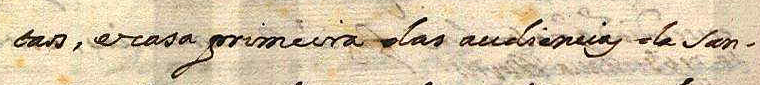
taos, e casa primeira das audiencias da san
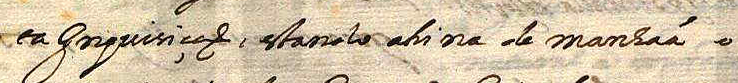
ta Jnquisiçaõ, estando ahi na de manhaā o
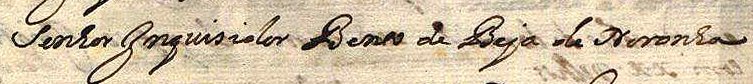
Senhor Jnquisidor Bento de Beja de Noronha
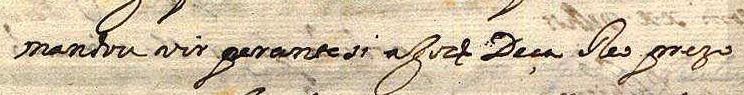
mandou vir perante si a Joaõ Deça Reo prezo
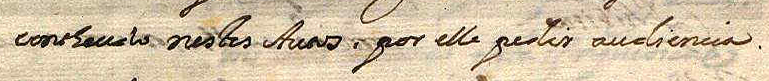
contheudo nestes Autos, por elle pedir audiencia.
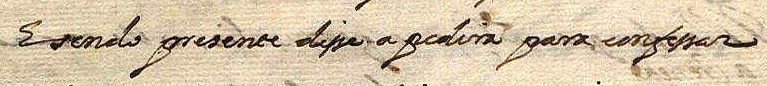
E sendo presente disse a pedira para confessar
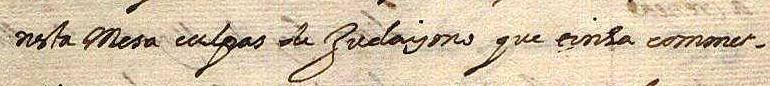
nesta Mesa culpas de Judaismo que tinha commet
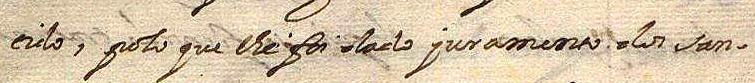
tido, polo que lhe foi dado juramento dos san
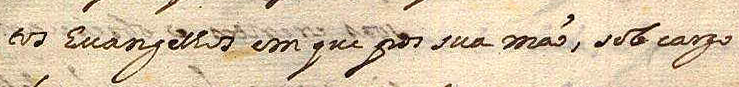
tos Euangelhos em que pos sua maõ, sob cargo
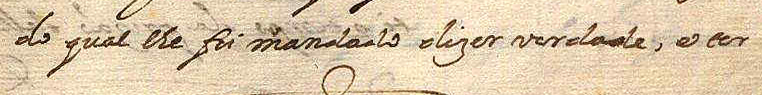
do qual lhe foi mandado dizer verdade, e ter
